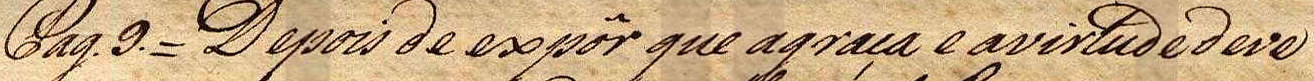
Pag. 9. = Depois de expôr que a graça e virtude deve
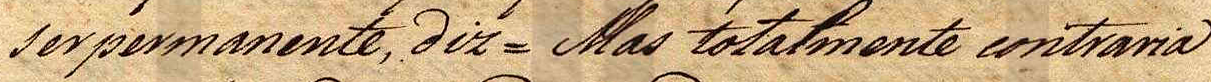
ser permanente, diz = Mas totalmente contraria
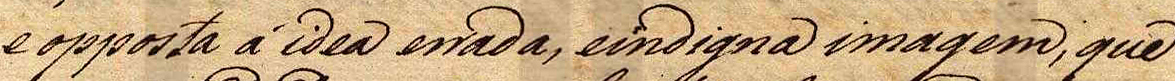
e opposta á idea errada, e indigna imagem, que
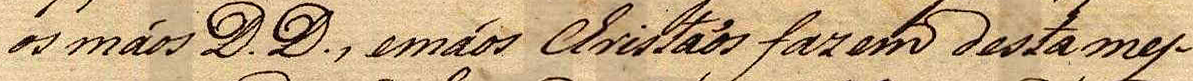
os máos D.D., e máos Christaõs fazem desta mes
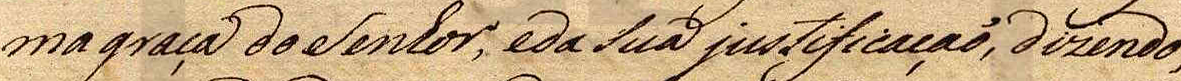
ma graça do Senhor, e da Sua justificaçaõ, dizendo
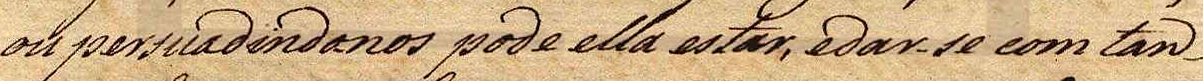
ou persuadindonos pode ella estar, e dar-se com tan
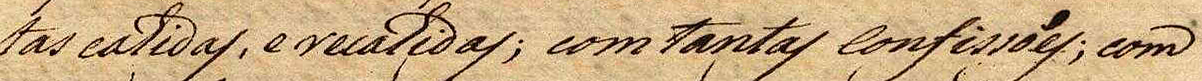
tas cahidas, e recahidas; com tantas confissões; com
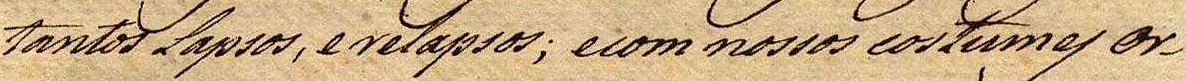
tantos Lapsos, e relapsos; e com nossos costumes or
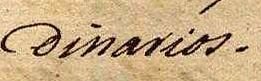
dinarios.
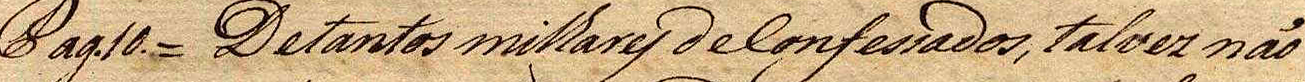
Pag.10. = De tantos milhares de Confessados, talvez naõ
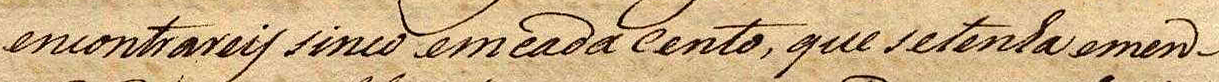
encontrareis sinco em cada cento, que se tenha emen
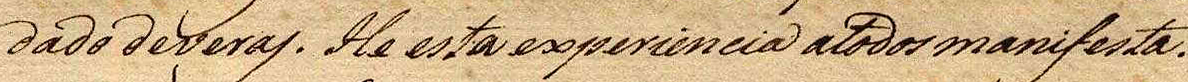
dado deveras. He esta experiencia a todos manifesta.
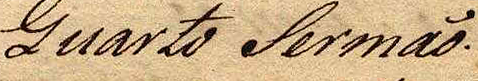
Quarto Sermaõ.
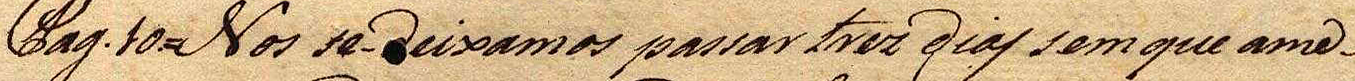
Pag. 10. = Nos se-deixamos passar trez dias sem que ame
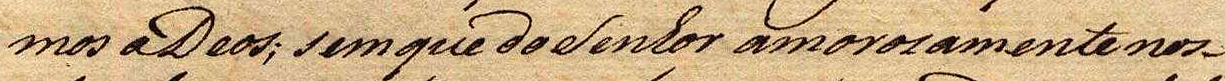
mos a Deos; sem que do Senhor amorozamente nos-
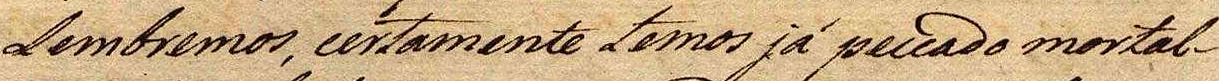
Lembremos, certamente temos já peccado mortal
